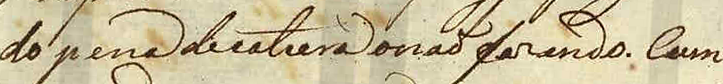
do pena de catura o naõ fazendo. Cum
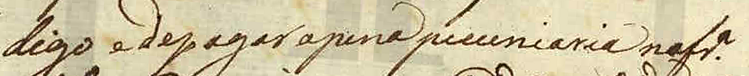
digo e de pagar a pena pecuniaria na fr.a
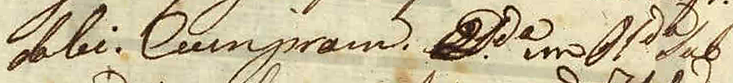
da lei: Cumpram. _.da em Ol.da sub
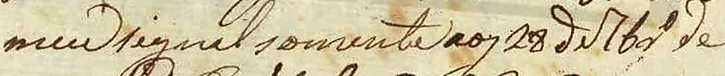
meu signal somente aos 28 de 7br.o de
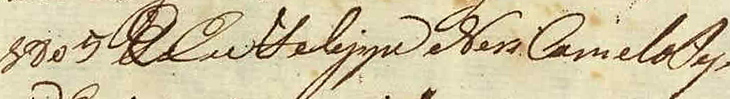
1805 E Eu Felippe Neri Camelo Pes
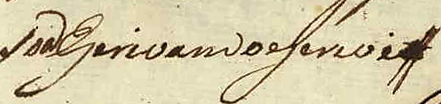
soa Escrivam o escrevi
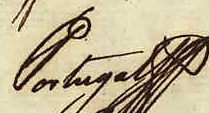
Portugal
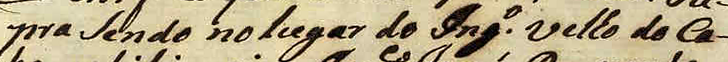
pra sendo no Lugar do Inq.o velho do Ca
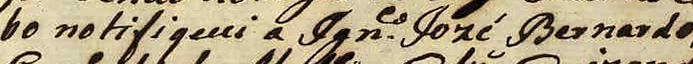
bo notifiquei a Ign.co Iozé Bernardo,
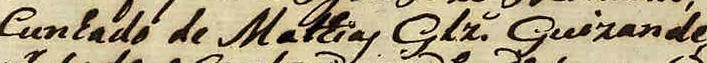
Cunhado de Mathias Glz.o Guizande
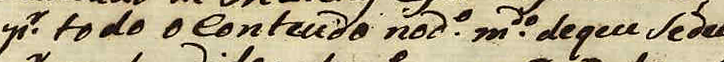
p.r todo o conteudo no d.o m.do de que se deo
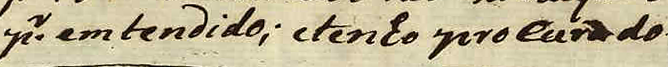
p.r emtendido; e tenho procurado
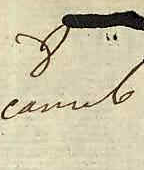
camelo
